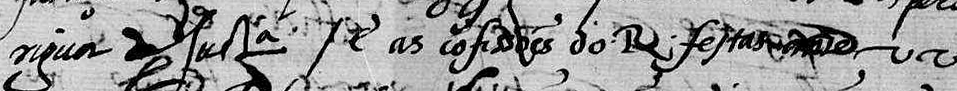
riguor da Justa / e as cōfissoẽs do .R. fejtas ante ut
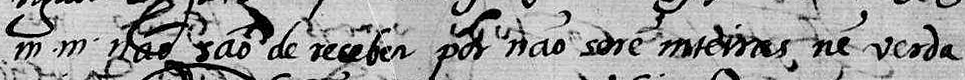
m. m. não saõ de receber por não serē inteiras nē verda
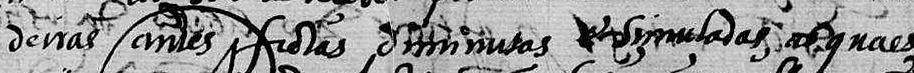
deiras antes fictas diminutas e simuladas, as quaes
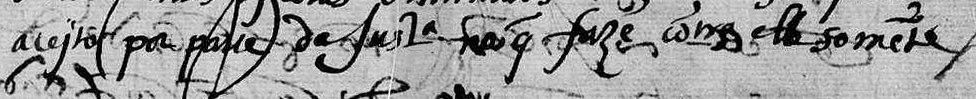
acejto por parte da Justa no q̄ fazē com elle somēte /
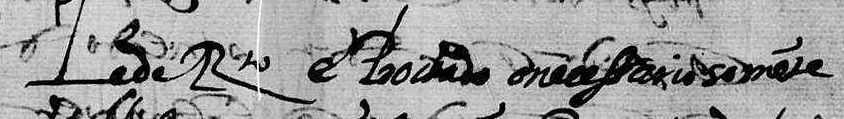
Pede Rto e Prouado o necessario somēte
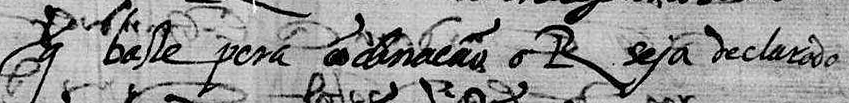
q̄ baste pera cōdenação o R seja declarado
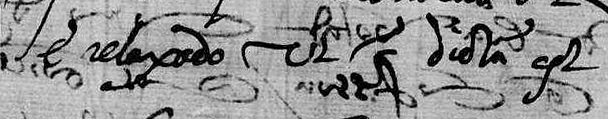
e relaxado ut q̄ dicta est
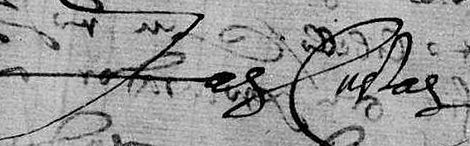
E as Custas
